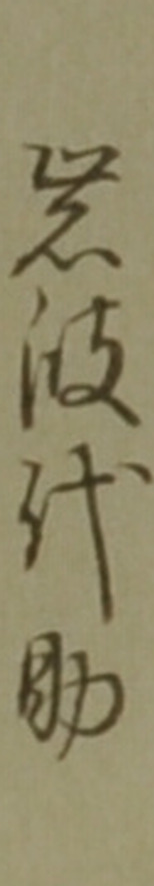岩波代助
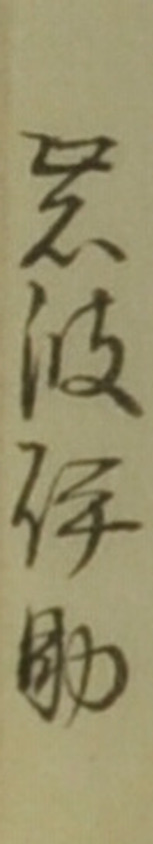岩波伊助

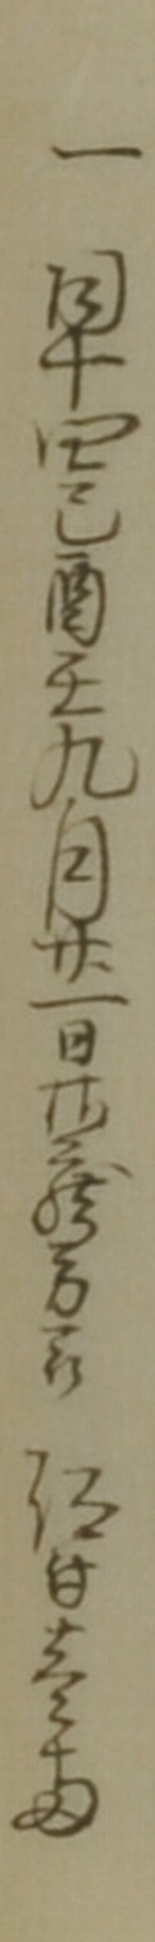一同十四己酉閏九月廿一日御蔵方被仰付壱両
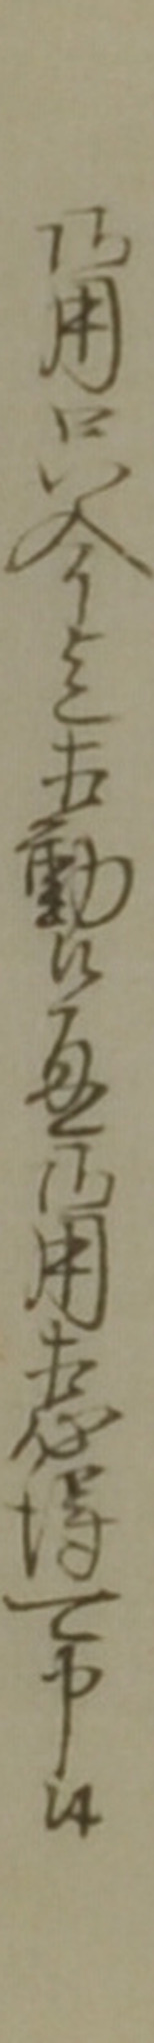御用只今迄相勤候通御用相心得可申候
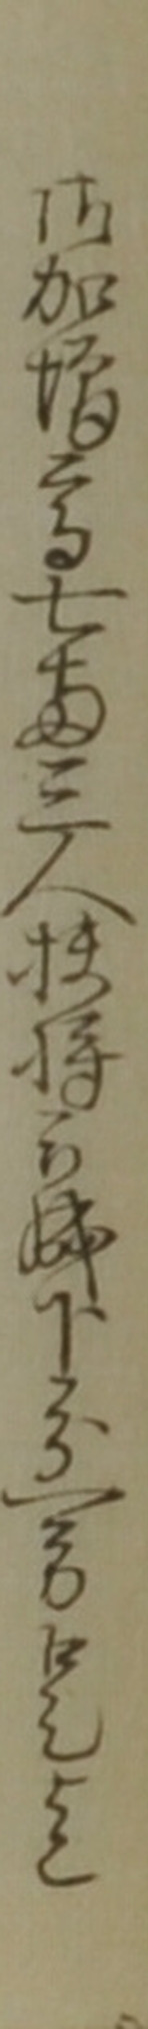御加増高七両三人扶持被成下分一方是迄
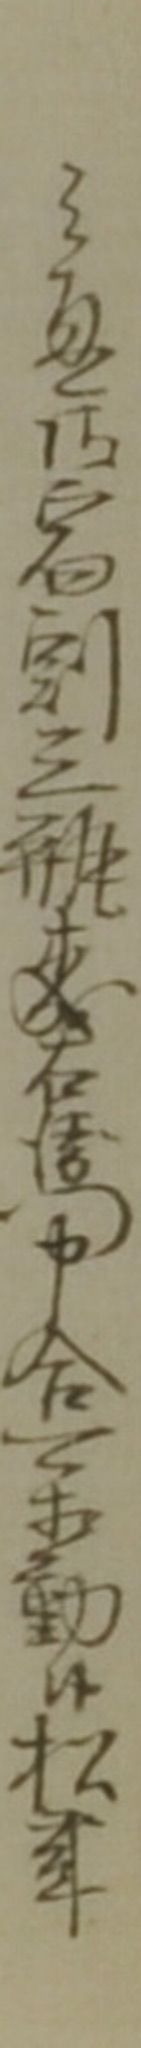之通御宿割三瓶森右衛門申合可相勤候松◻︎
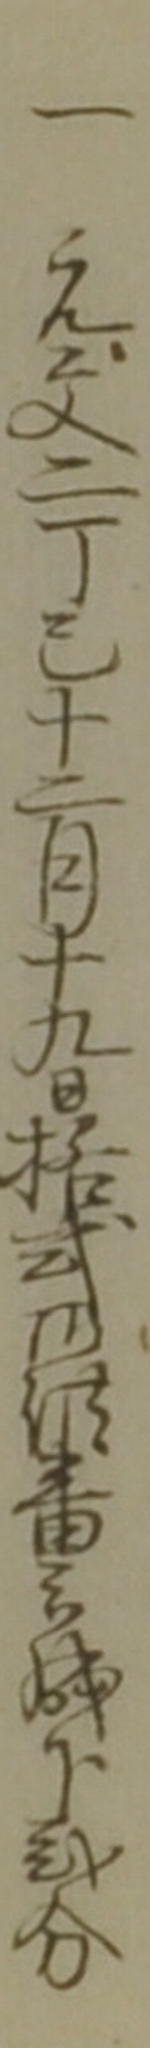一元文二丁巳十二月十九日格式御供番被成下弐分
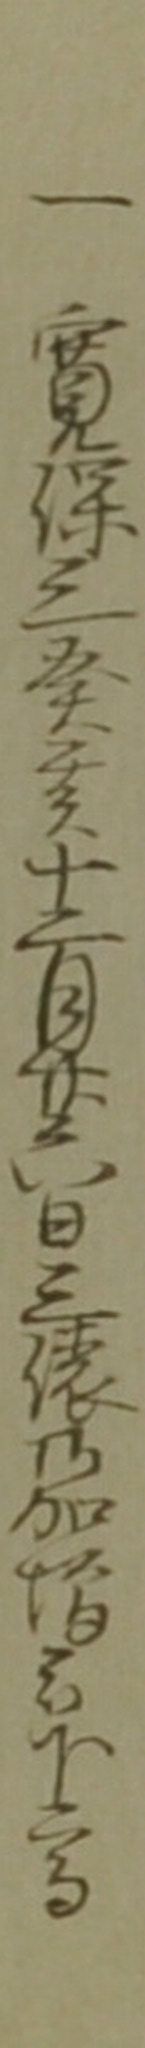一寛保三癸亥十二月廿六日三俵御加増被下高
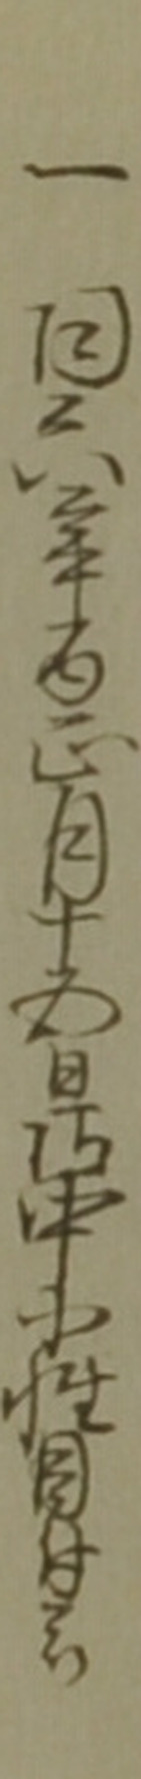一同六辛酉正月十五日御中小性目付被
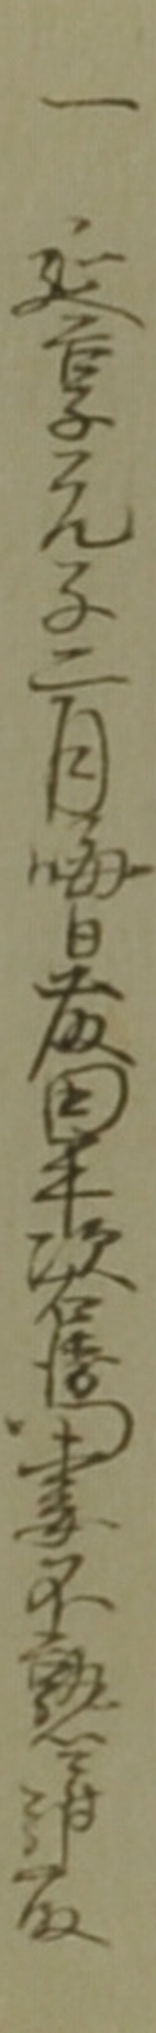一延享元子二月晦日藤田半次右衛門妻不熟ニ付◻︎
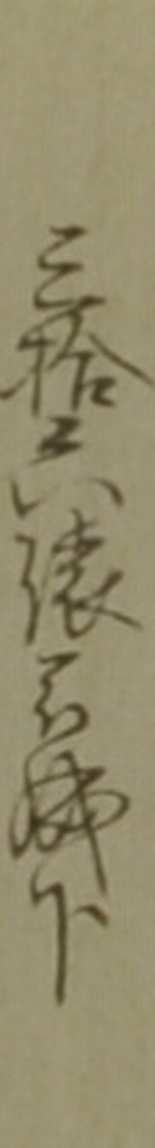三拾六俵被成下
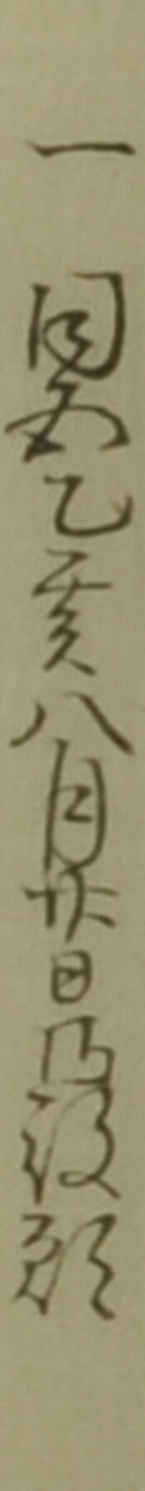一同五乙亥八月廿日御役願
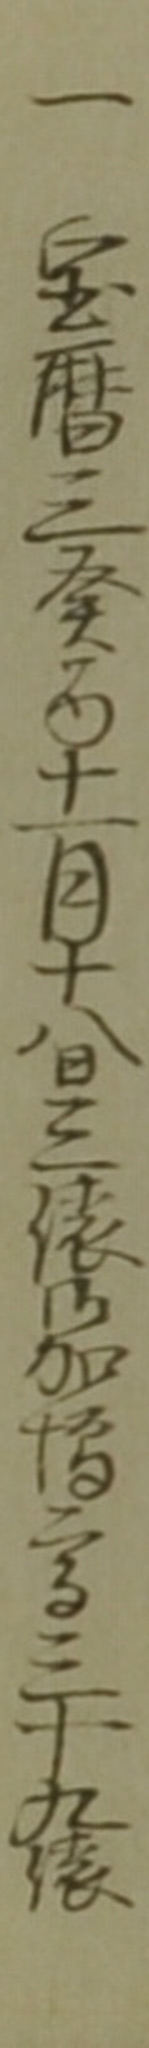一宝暦三癸酉十一月十八日三俵御加増高三十九俵
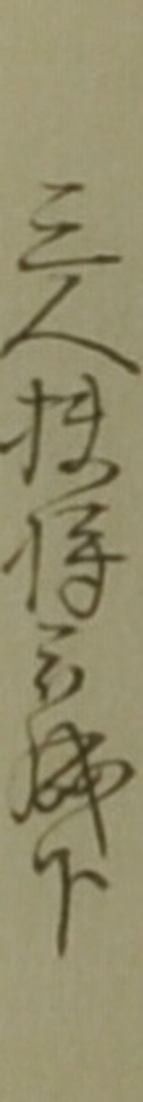三人扶持被成下
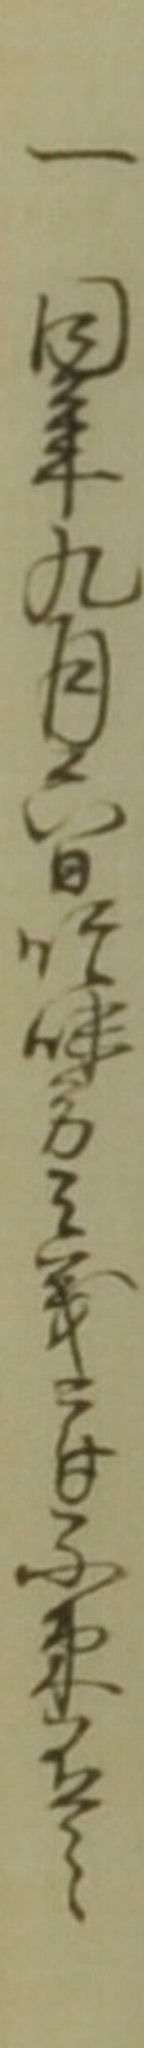一同年九月六日吟味方之義ニ付不束有之

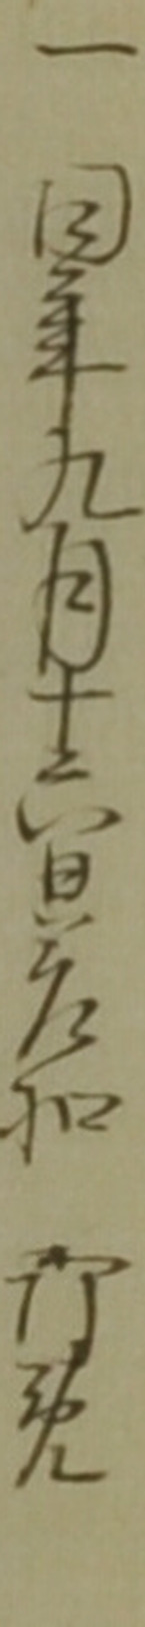一同年九月十六日差控御免
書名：無足廃家（壱）
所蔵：伊那市立高遠町図書館・合同会社AMANE
